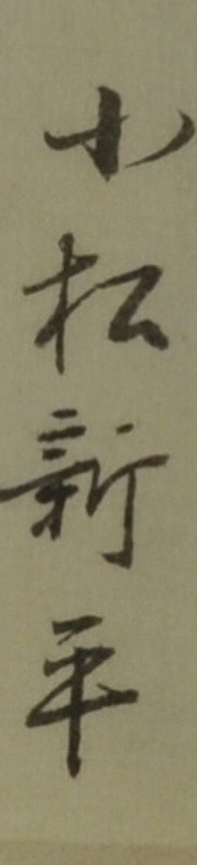小松新平
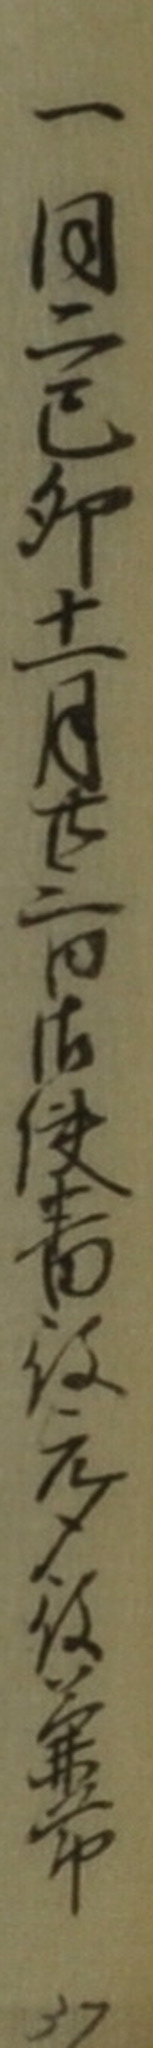一同二己卯十一月廿三日御使番役元〆役兼帯
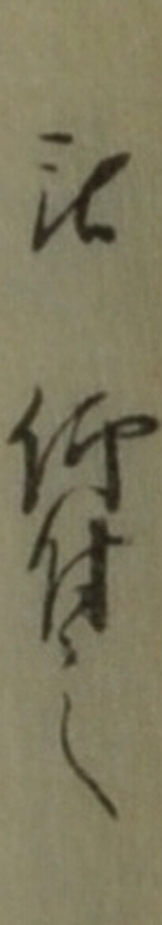被仰付之
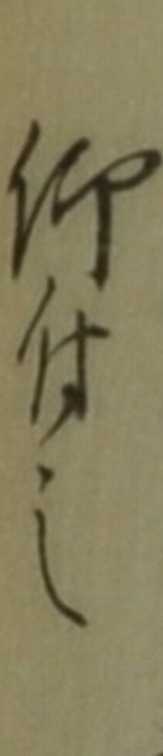仰付之
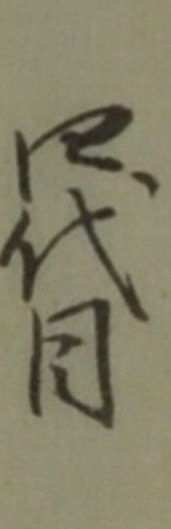四代目
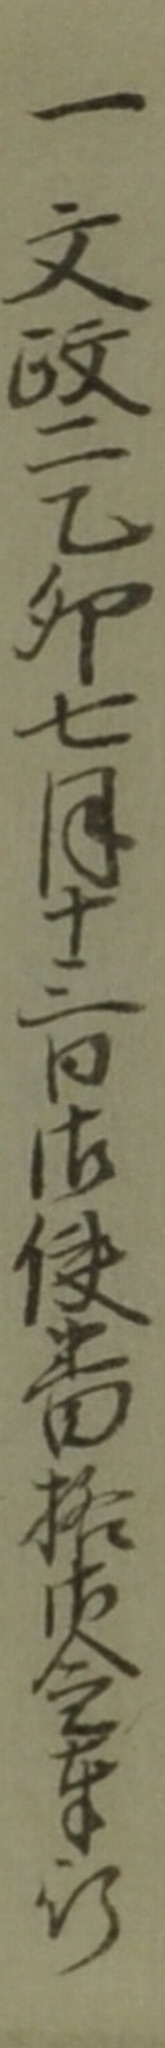一文政二乙卯七月十三日御使番格御金奉行
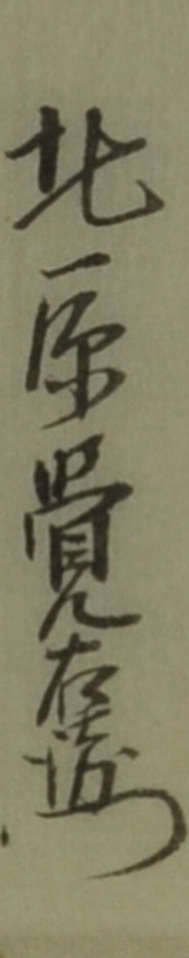北原覚右衛門
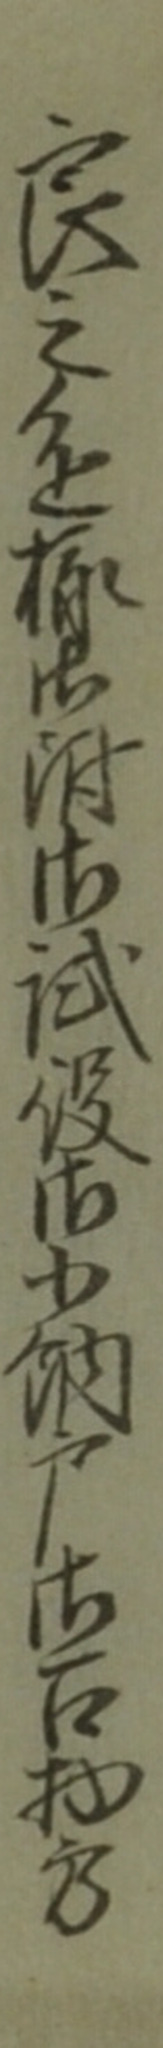良之進様御附御試役御小納戸御召物方
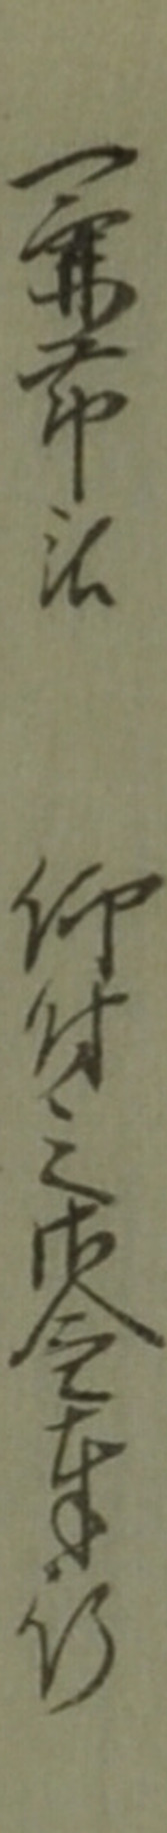兼帯被仰付之御金奉行
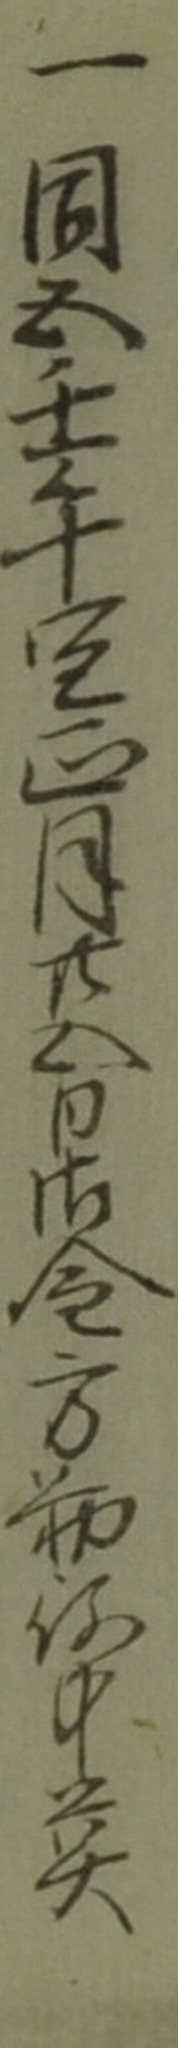一同五壬午閏正月廿五日御金方勤役中莫
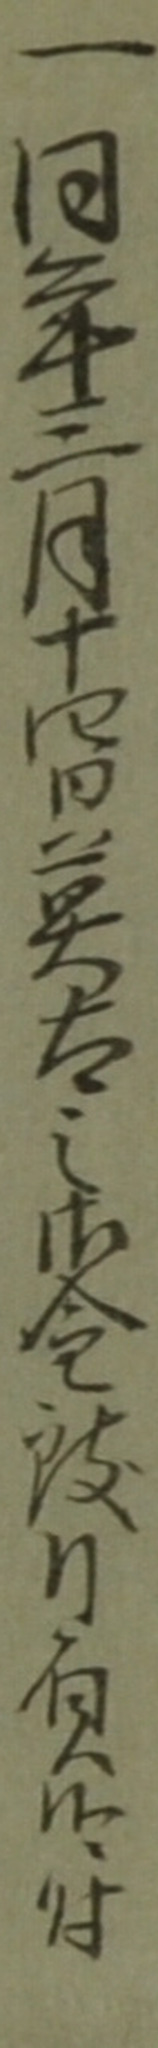一同年三月十四日莫太之御金致引負候ニ付
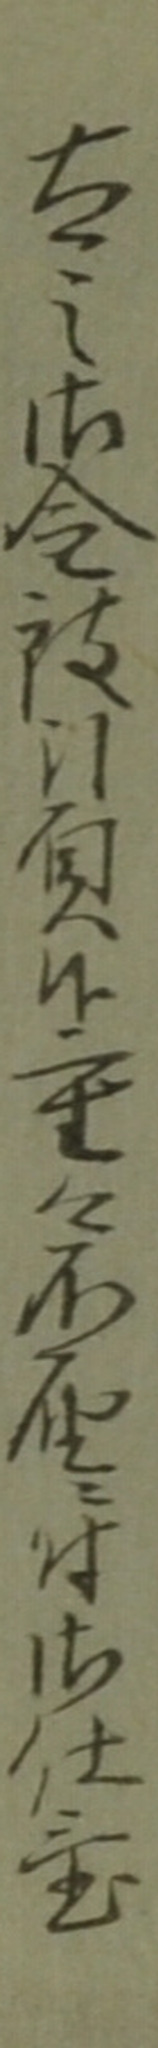太之御金致引負候重動々不届ニ付御仕置
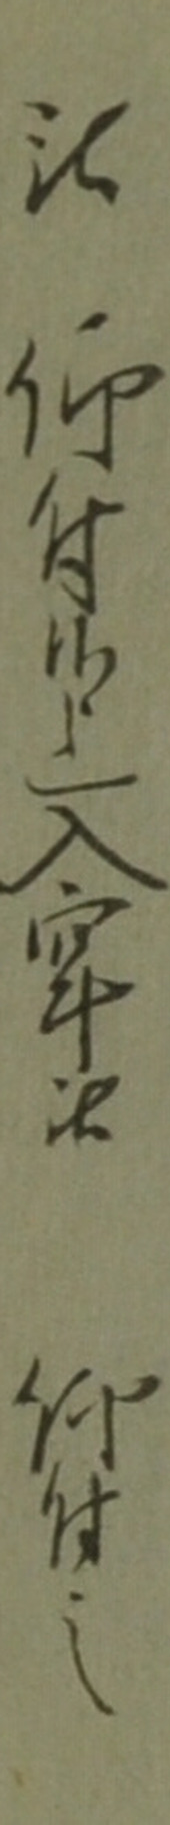被仰付候上入牢被仰付之
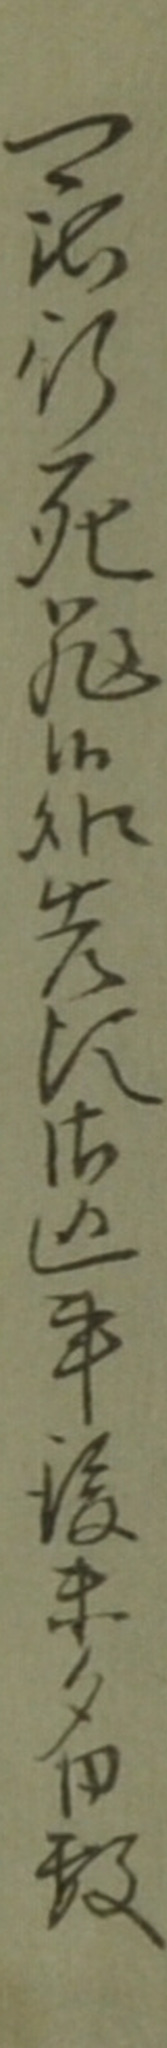可被行死罪候様先頃御込事後未タ日数
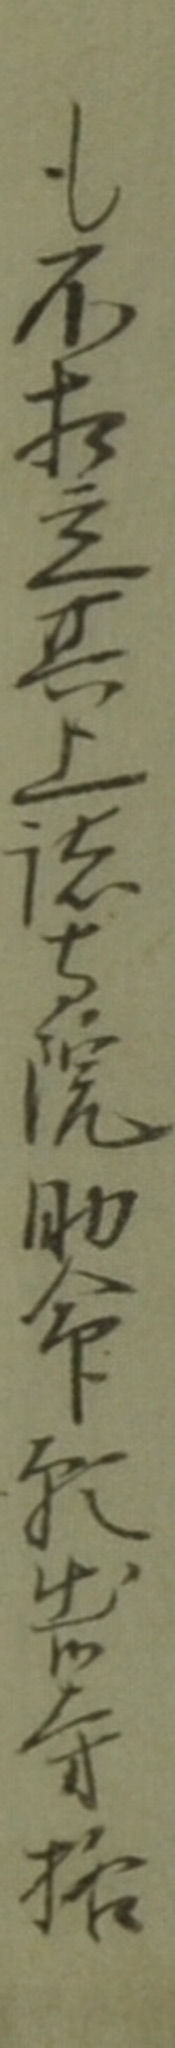も不相立其上諸寺院助命願出候旁格
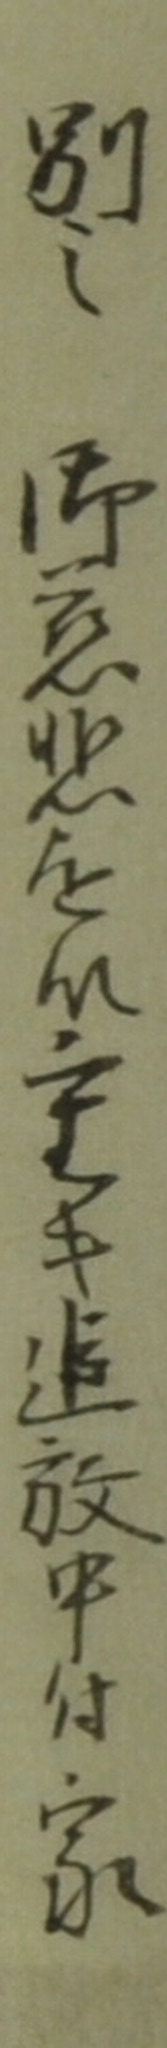別之御慈悲を以重キ追放申付家
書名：諸御役代々録（四）
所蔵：伊那市立高遠町図書館・合同会社AMANE
